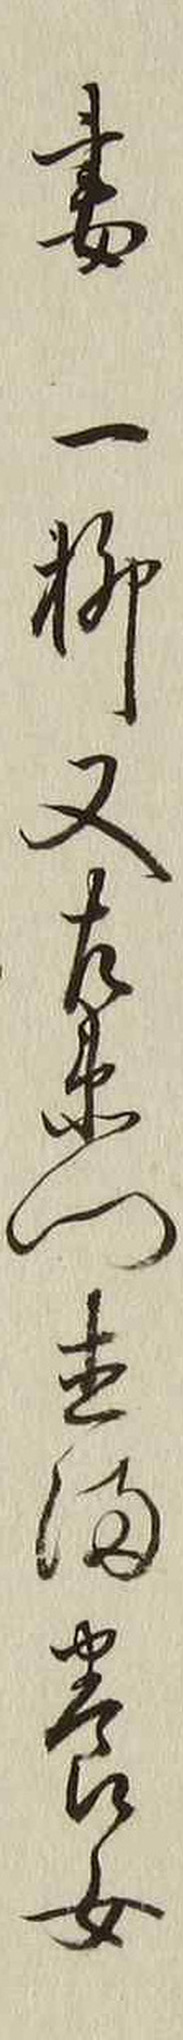妻一柳又左衛門直満養女
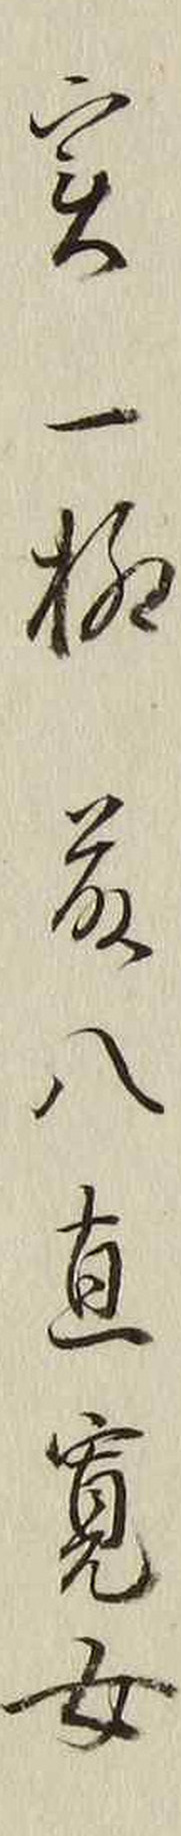実一様藤八直寛女
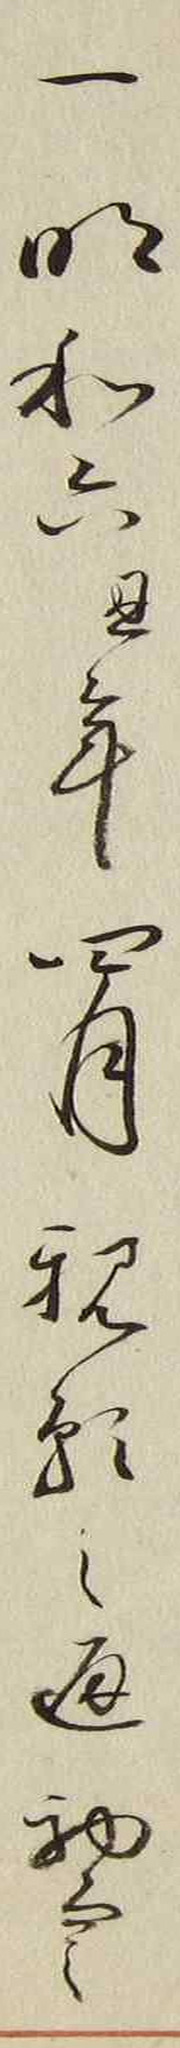一明和六丑年四月親願之通初而之
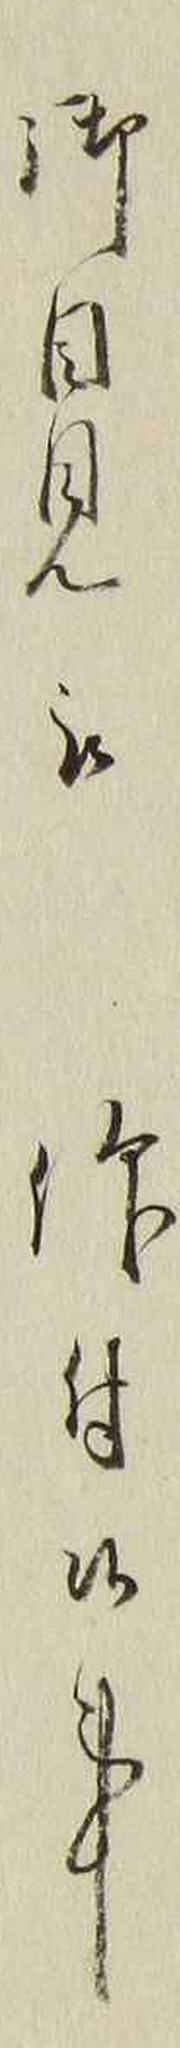御目見被仰付候事

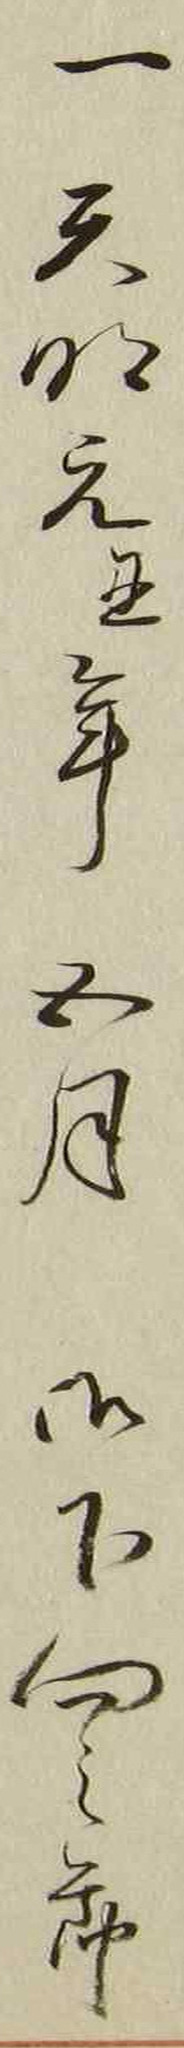一天明元丑年五月御下向之節
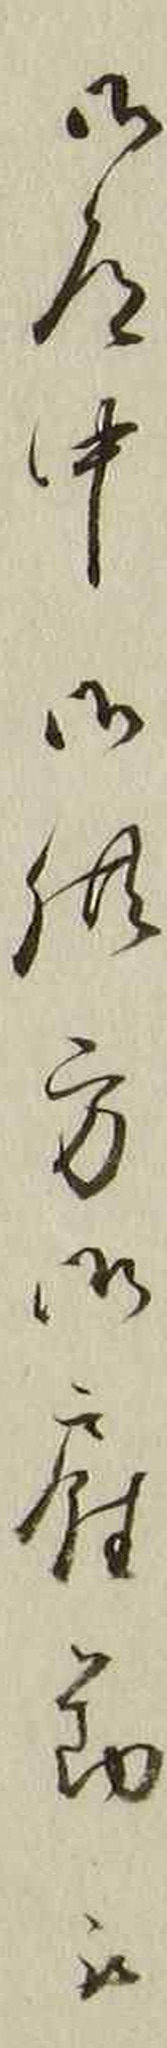御道中御供方御雇勤被
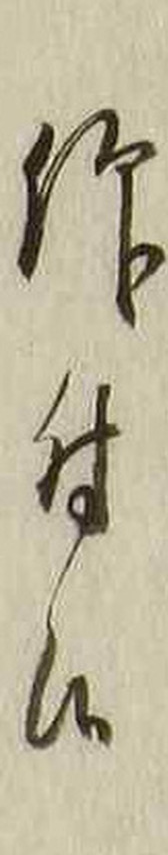仰付候
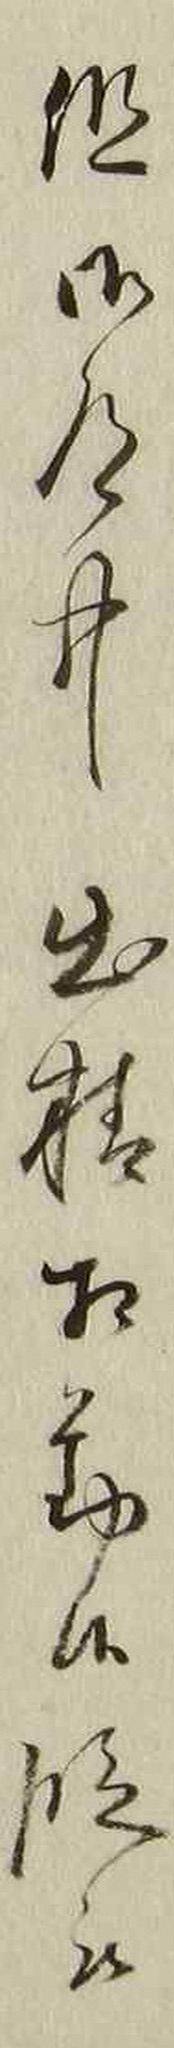但御道中出精相勤候段被
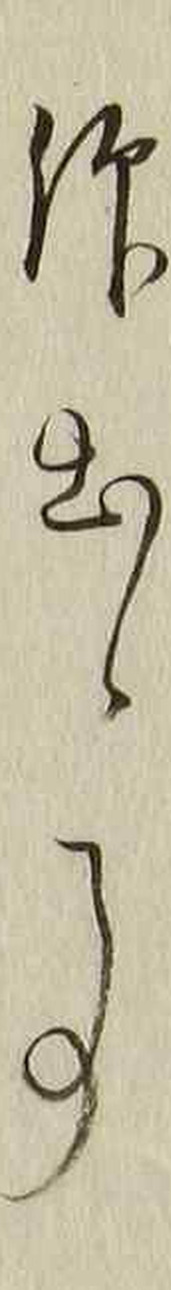仰出候事
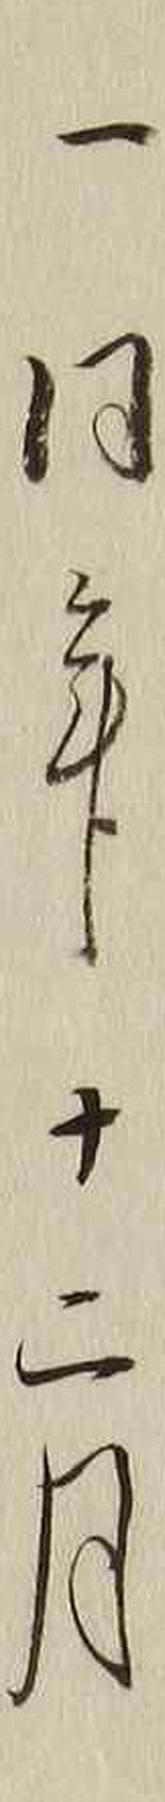一同年十二月
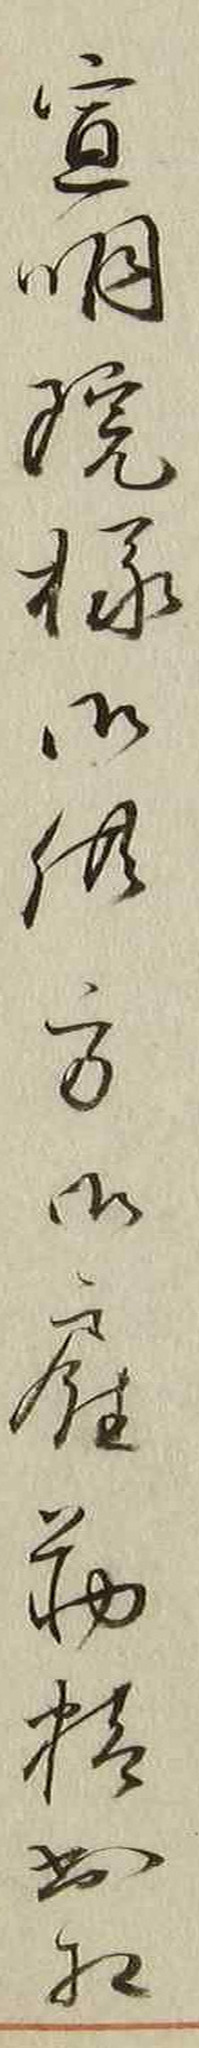宣明院様御供方御雇勤精出相
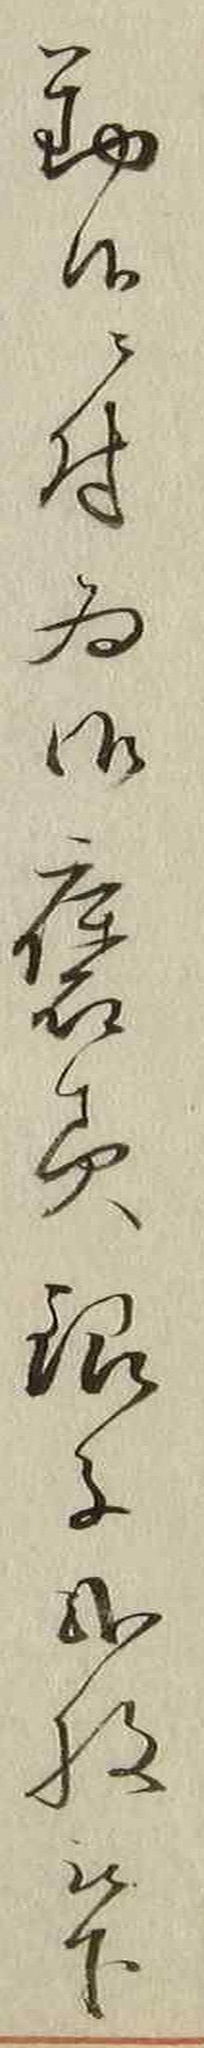勤候ニ付為御褒美銀子弐枚被下
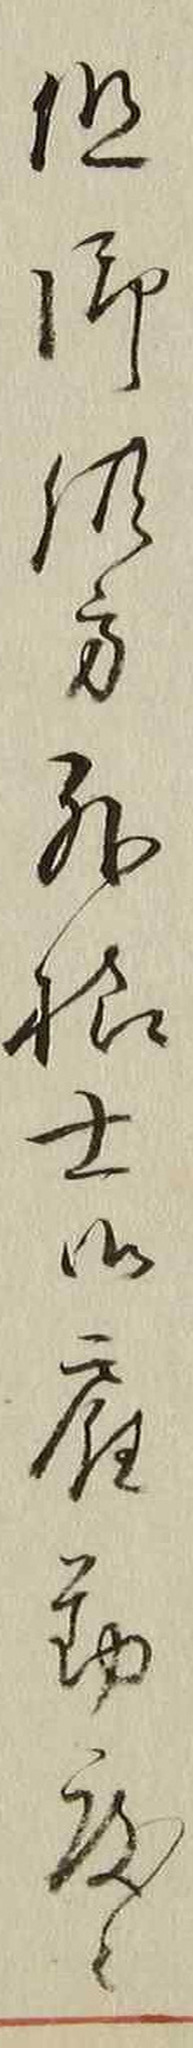但御供方外様士御雇勤度々
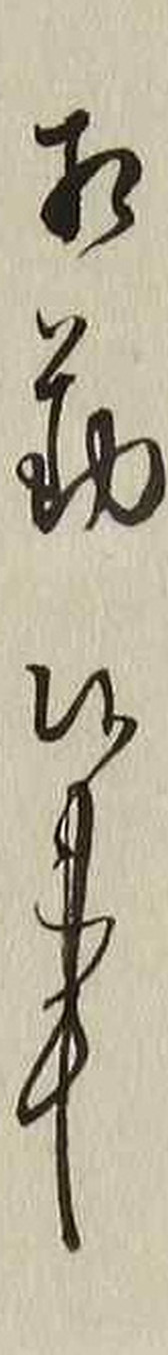相勤候事
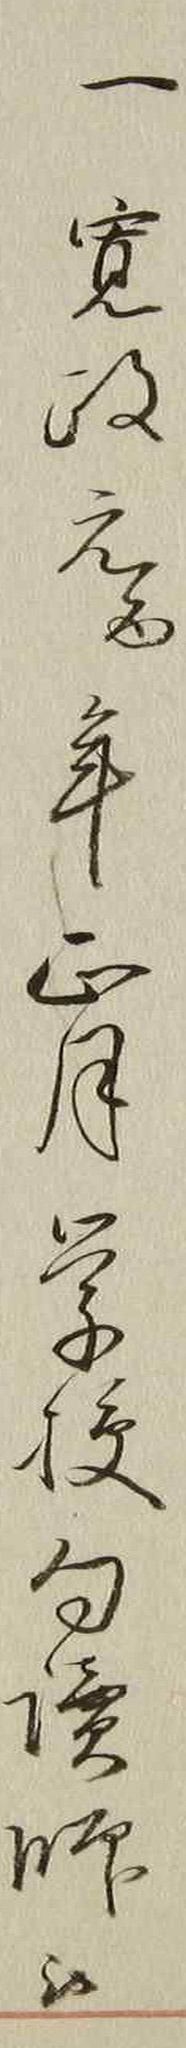一寛改元酉年正月学校句読師被
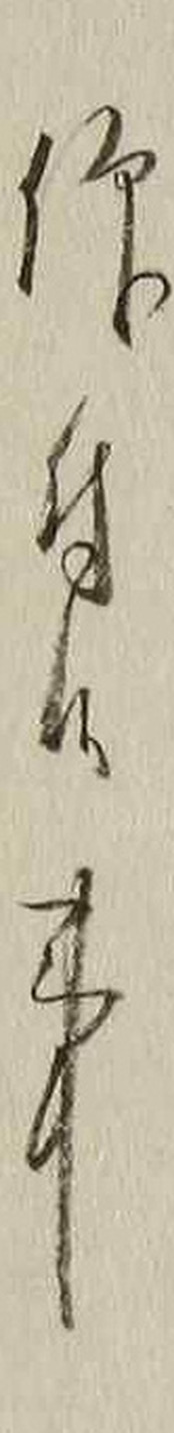仰付候事
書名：諸士系譜　巻之28　い之部28
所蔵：会津若松市立会津図書館
